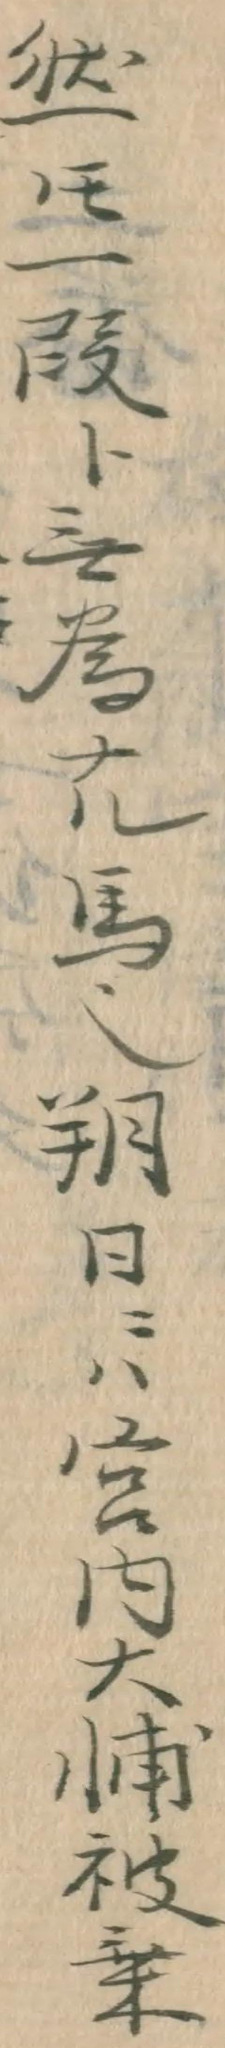然トモ一段ト無為ナル馬也朔日ニハ宮内大輔被乗
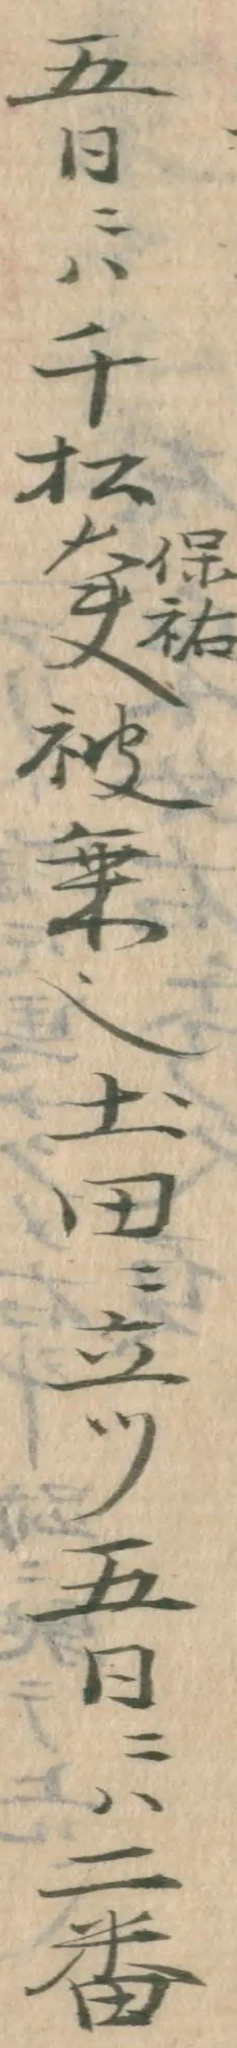五日ニハ千松大夫被乗也土田ニ立ツ五日ニハ二番
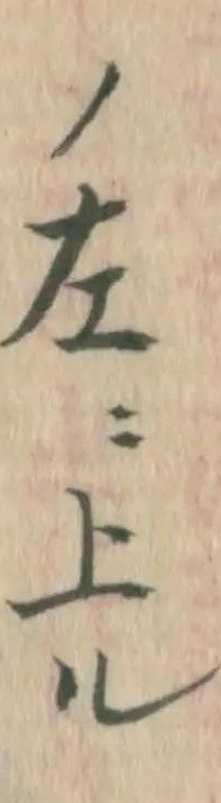ノ左ニ上ル
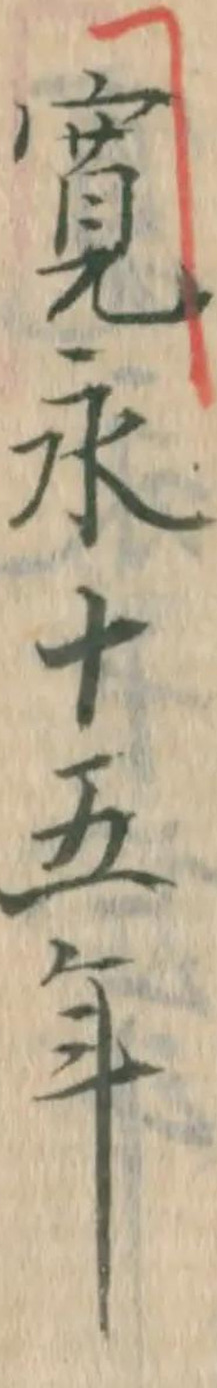寛永十五年
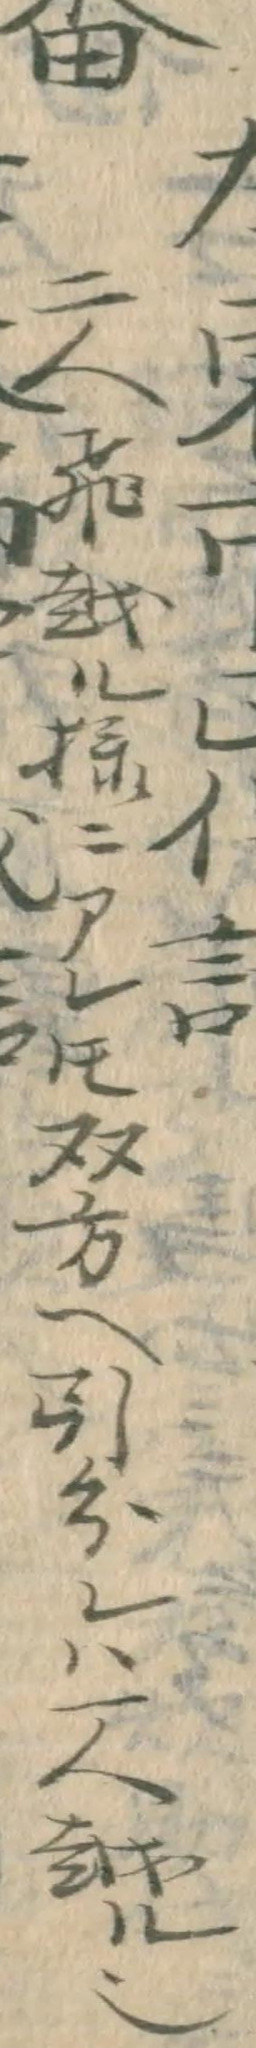二人飛越ル様ニアレトモ双方ヘ引分レハ一人越ル也
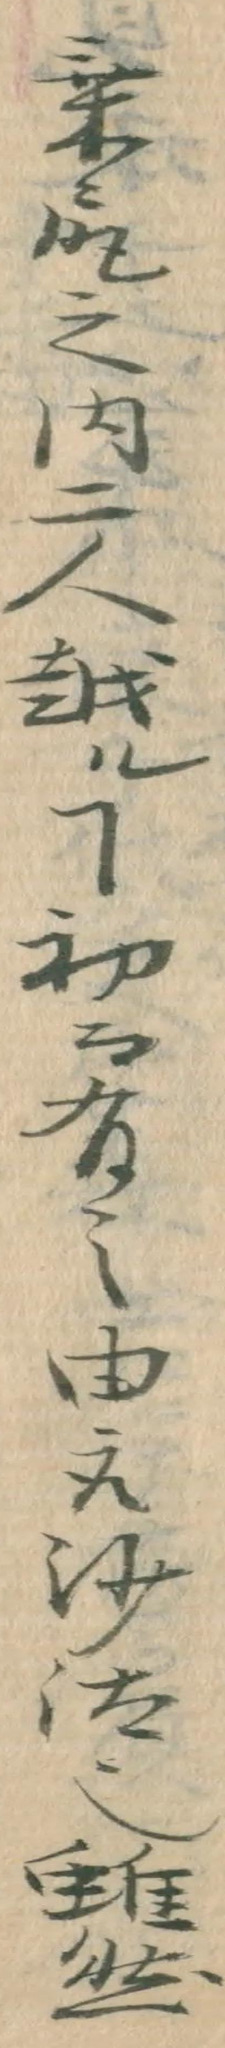乗尻之内二人越ルコト初而有之由取沙汰也雖然
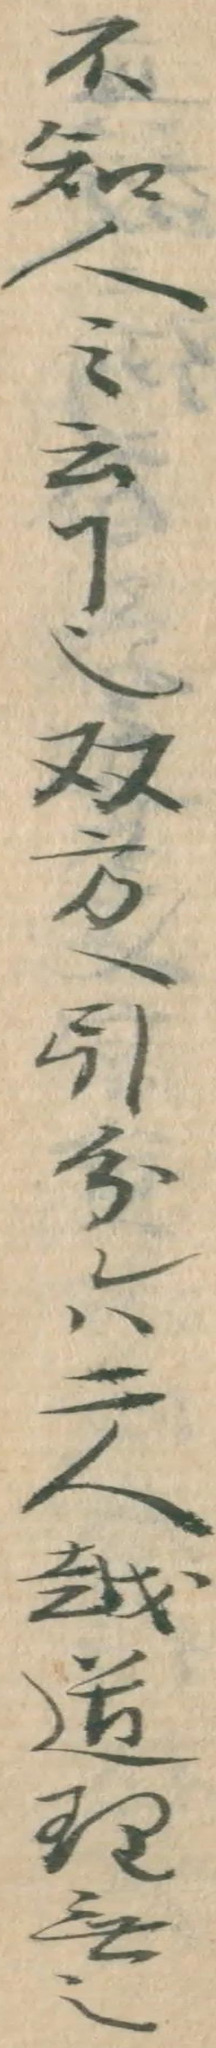不知人之云コト也双方へ引分レハ二人越道理無之

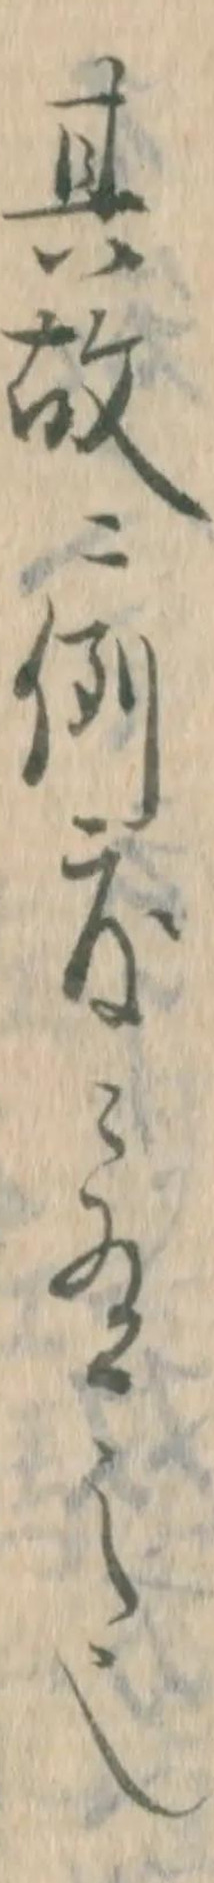其故ニ例度々有之也
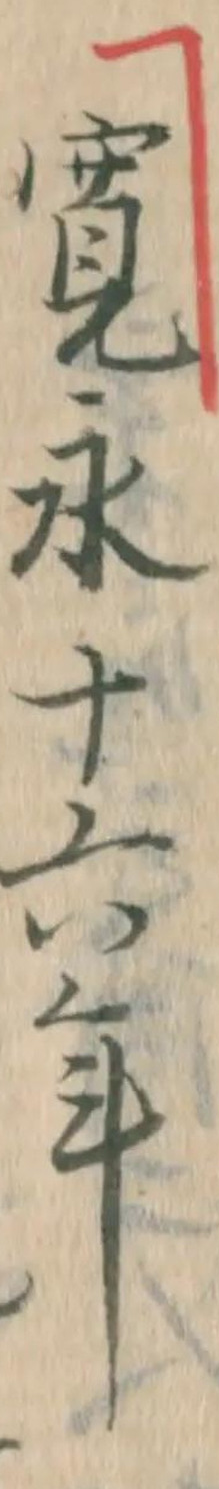寛永十六年
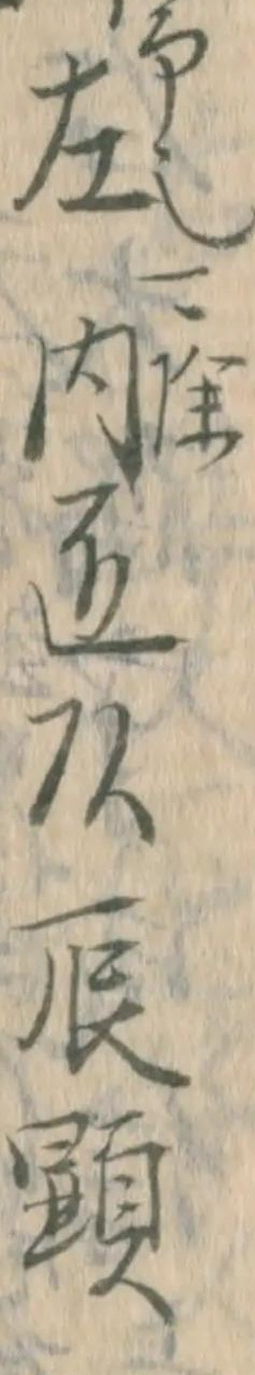左内匠頭辰顕
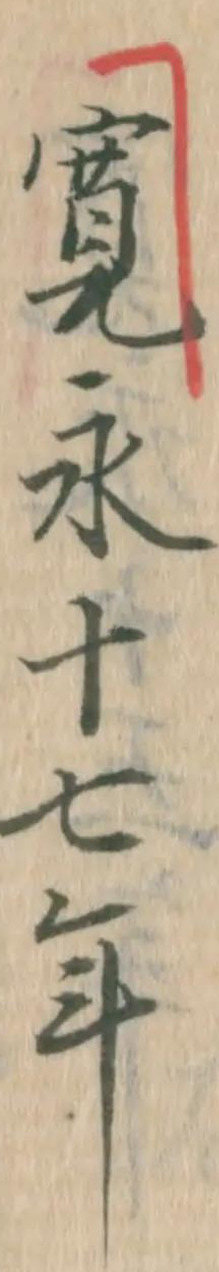寛永十七年
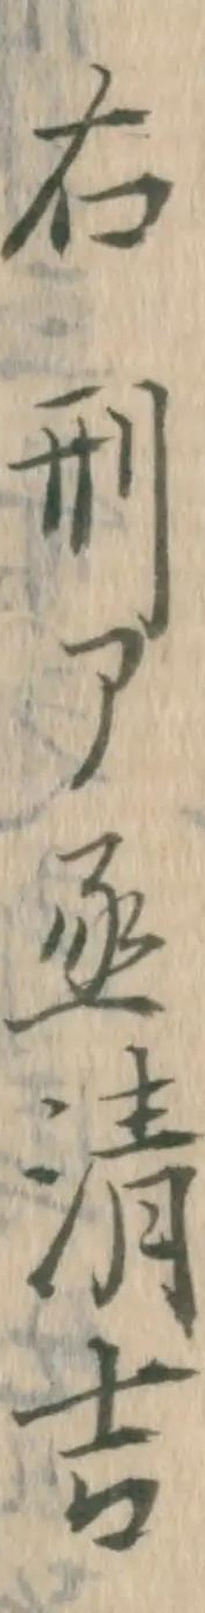右刑部丞清吉
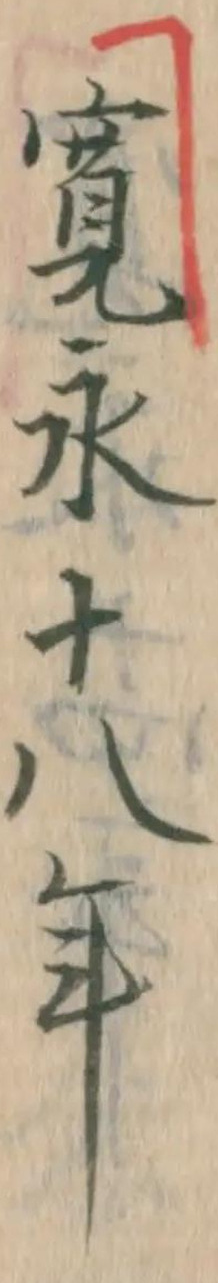寛永十八年
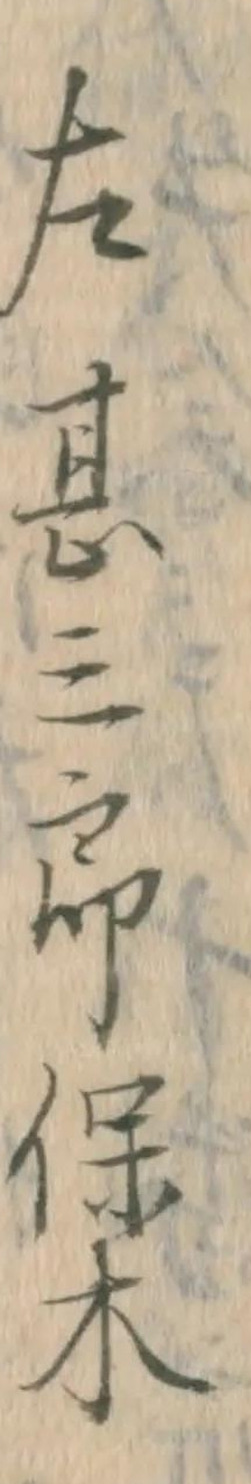左甚三郎保木
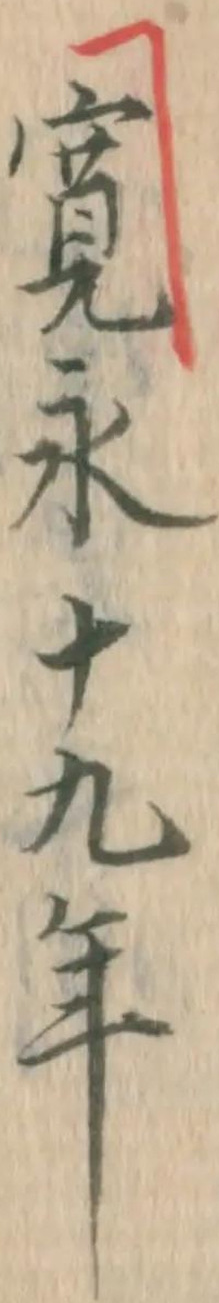寛永十九年
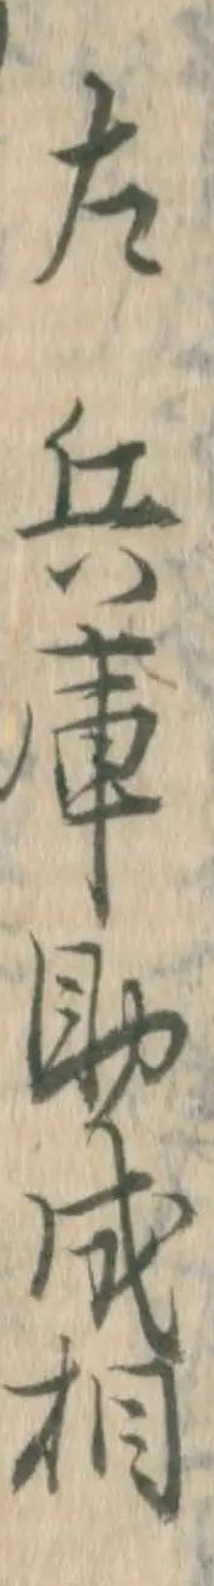左兵庫助成相
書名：賀茂社記録. 第10冊
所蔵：国立国会図書館 National Diet Library, JAPAN
